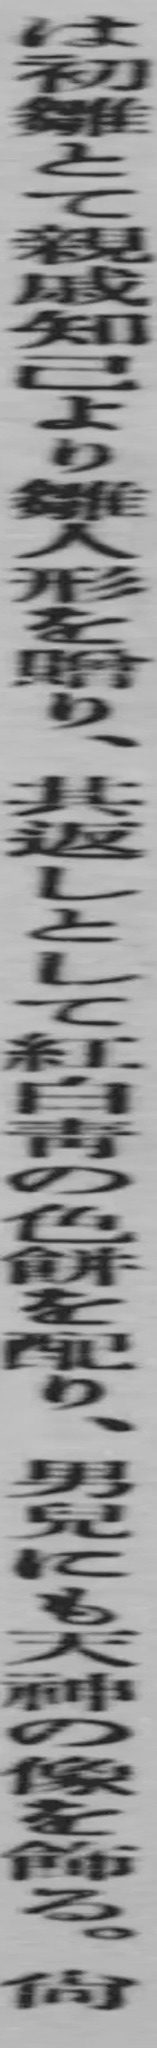は初雛とて親戚知己より雛人形を贈り、其返しとして紅白靑の色餅を配り、男兒にも天神の像を飾る。尚
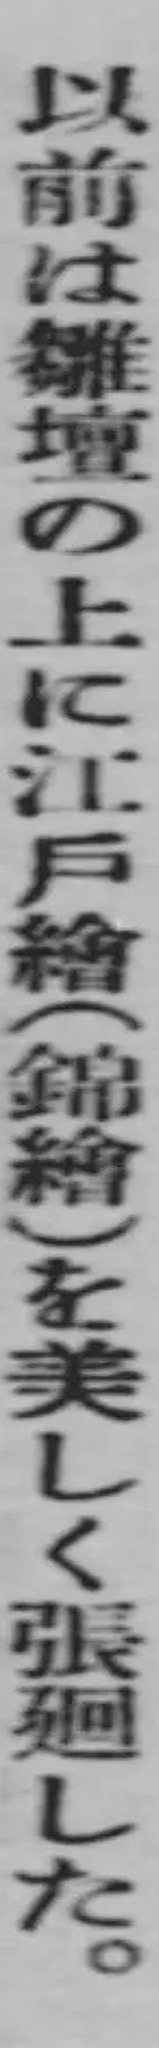以前は雛壇の上に江戸繪(錦繪)を美しく張廻した。
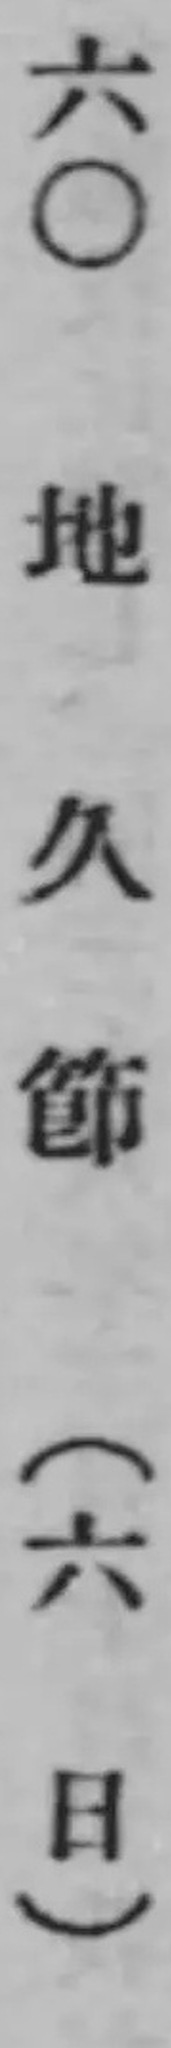六〇地久節(六日)
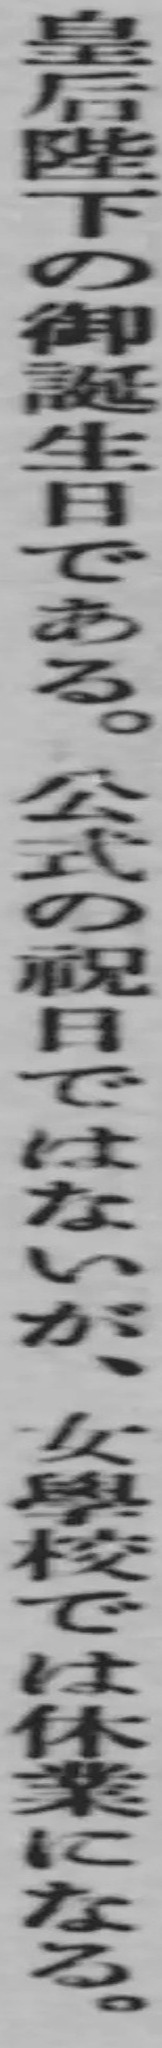皇后陛下の御誕生日である。公式の祝日ではないが、女樂校では休業になる。

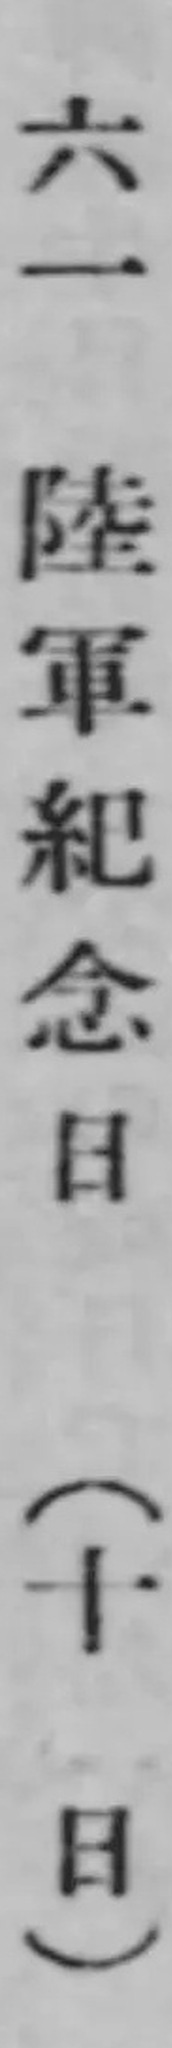六一陸軍紀念日(十日)
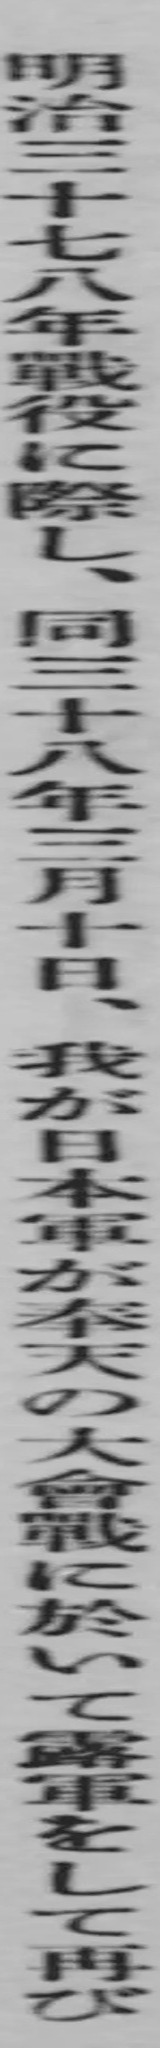明治三十七八年戰役に際し、同三十八年三月十日、我が日本軍が奉天の大會戰に於いて露軍をして再び
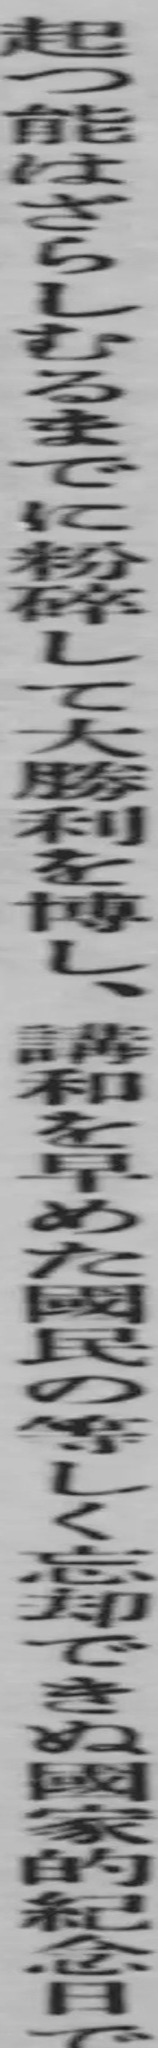起つ能はざらしむるまでに粉碎して大勝利を博し、講和を早めた國民の等しく忘却できぬ國家的紀念日で
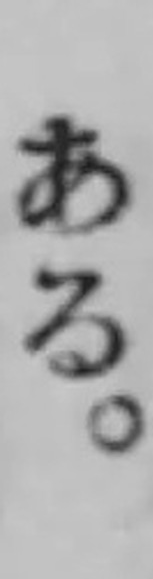ある。
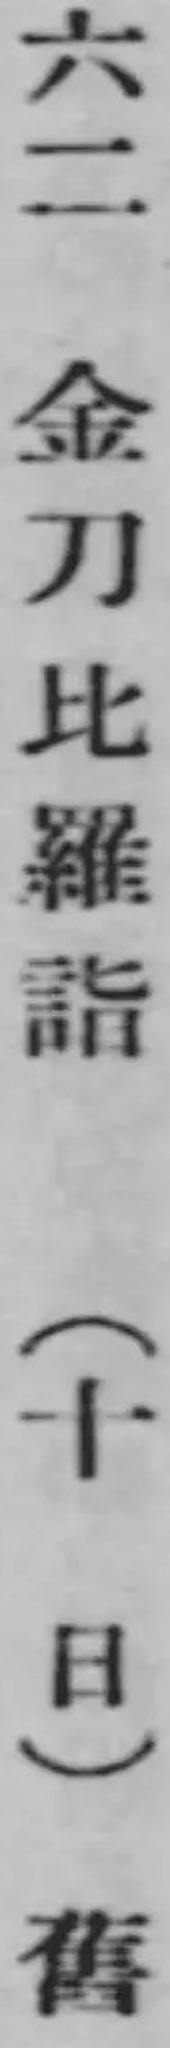六二金刀比羅詣(十日)舊
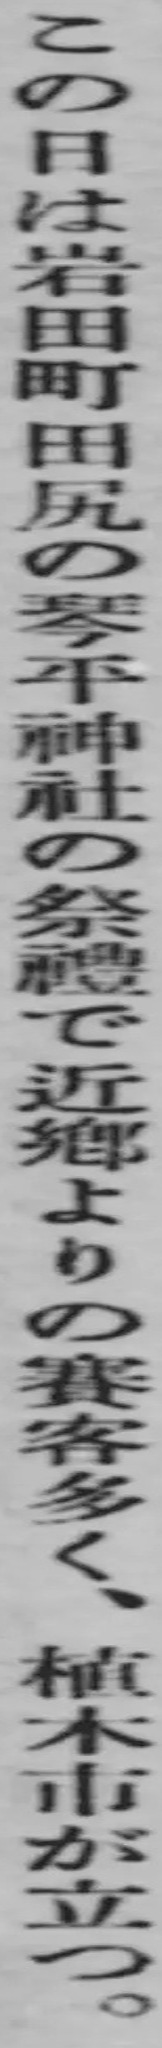この日は岩田町田尻の琴平神社の祭禮で近鄕よりの賽客多く、植木市が立つ。
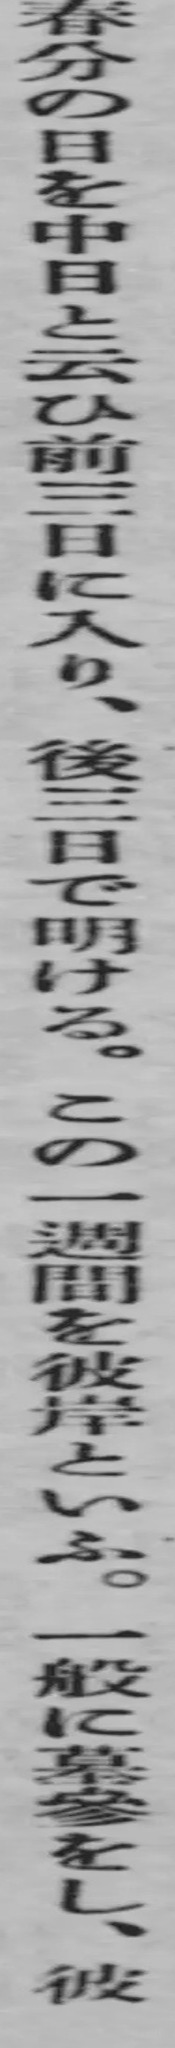春分の日を中日と云ひ前三日に入り、後三日で明ける。この一週間を彼岸といふ。一般に墓參をし、彼
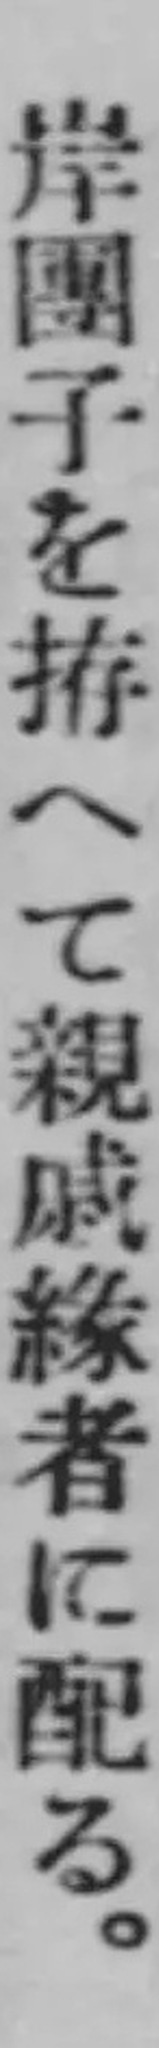岸團子を拵へて親戚緣者に配る。
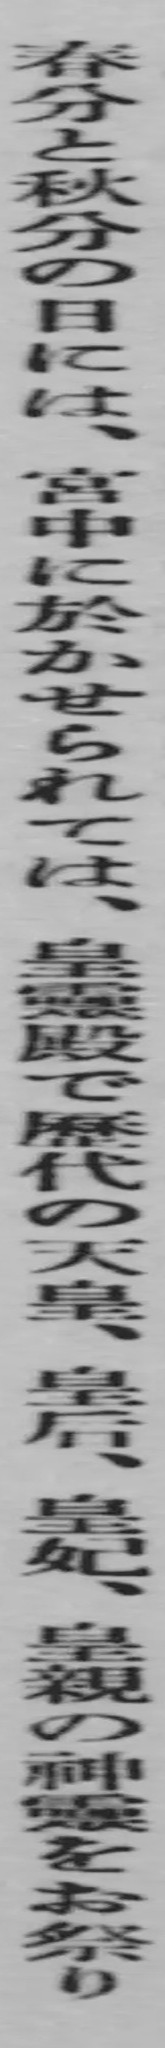春分と秋分の日には、宮中に於かせられては、皇靈殿で曆代の天皇、皇后、皇妃、皇親の神靈をお祭り
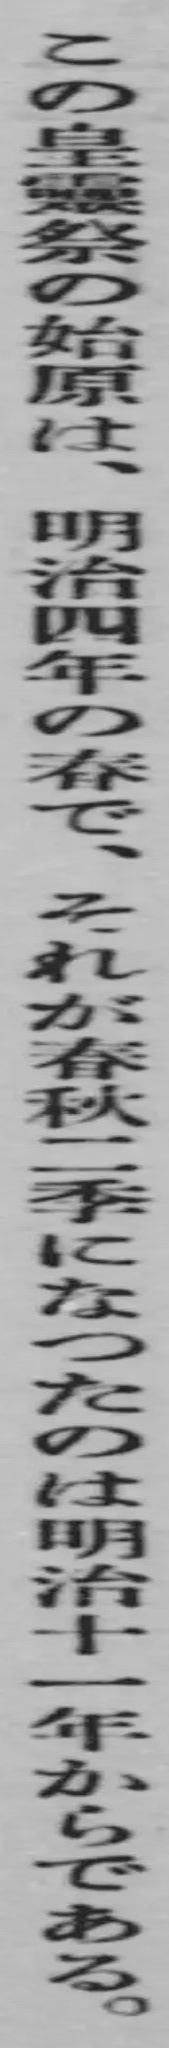この皇靈祭の始原は、明治四年の春で、それが春秋二季になつたのは明治十一年からである。
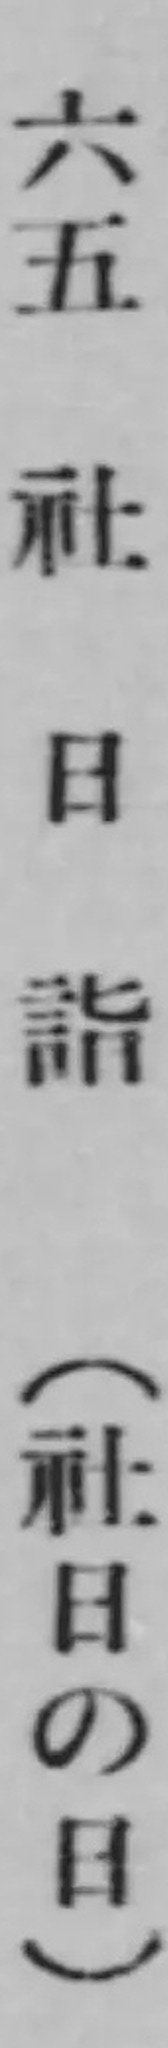六五社日詣(社日の日)
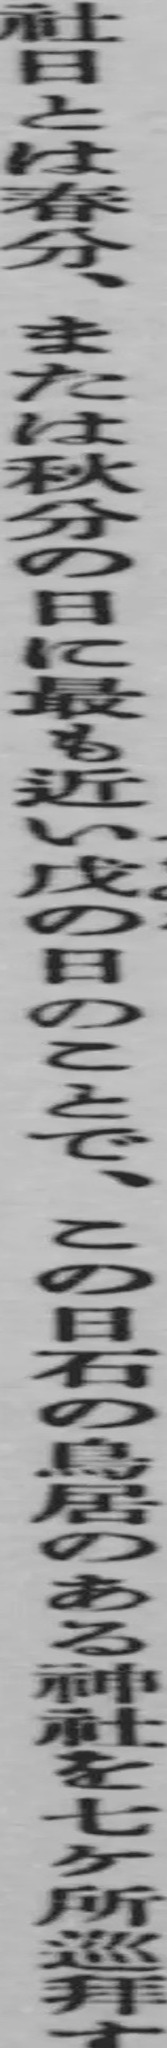社日とは春分、または秋分の日に最も近い戊の日のことで、この日石の鳥居のある神社を七ヶ所巡拜す
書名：豊橋の年中行事
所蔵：国立国会図書館 National Diet Library, JAPAN
